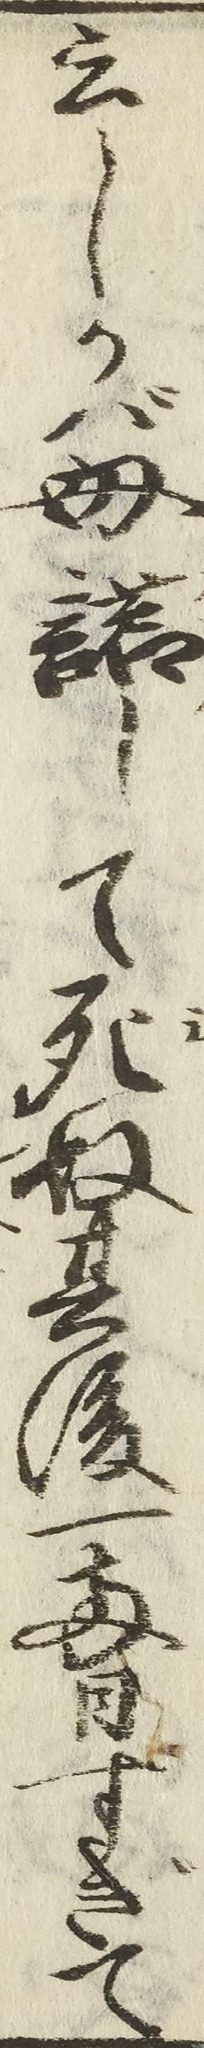云しかば母諾して死ぬ其後両月すぎて
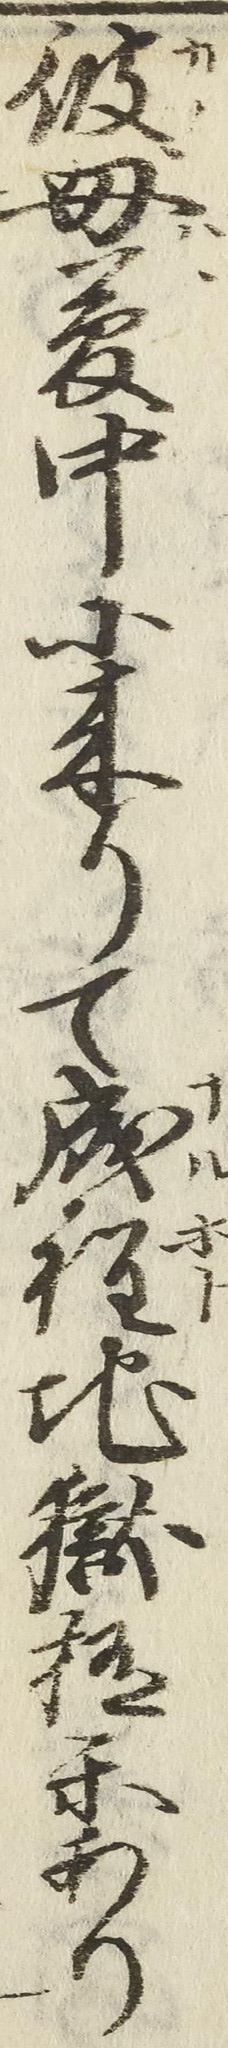彼母夢中に来りて成程地獄極楽あり
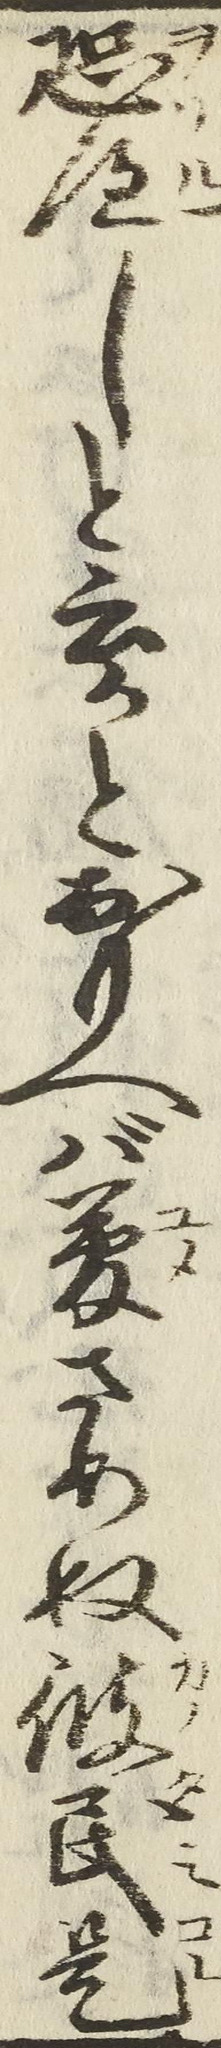恐へしと云かとおもへば夢さめぬ彼民是
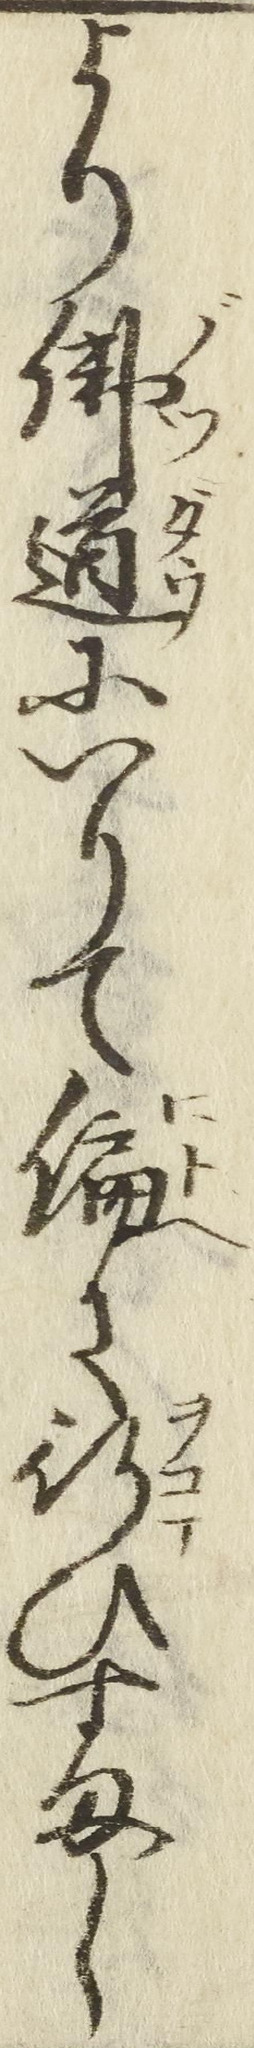より仏道にいりて偏に行ひすまし
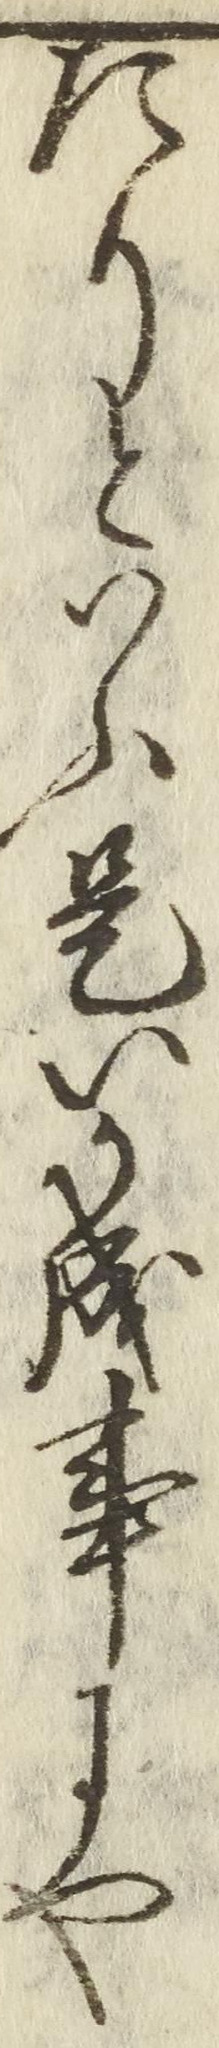たりといふ是いか成事にや
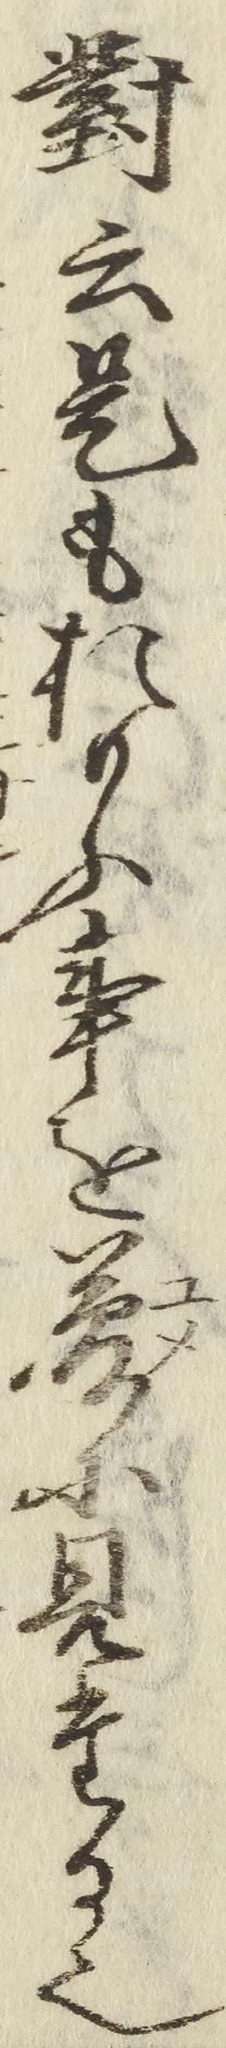対云是もおもふ事を夢に見たる也
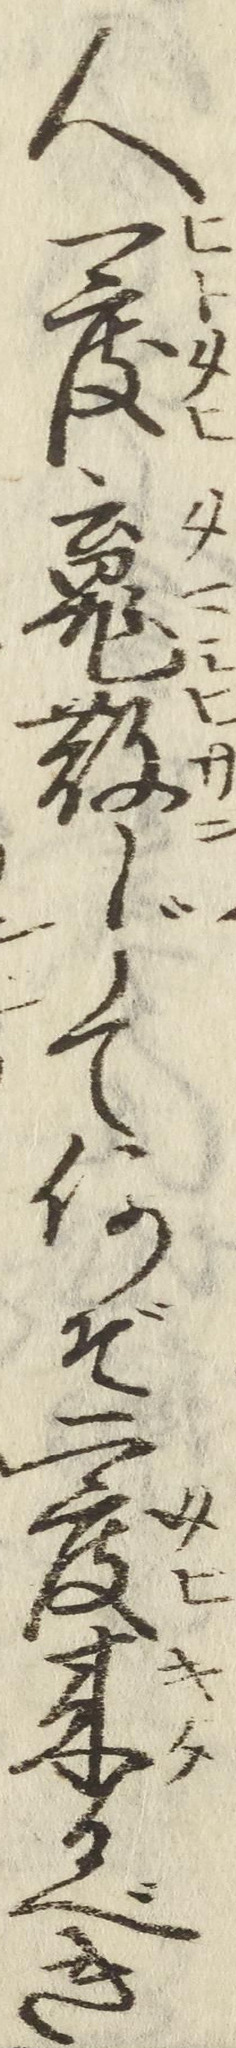人一度魂散じて何ぞ二度来るべき
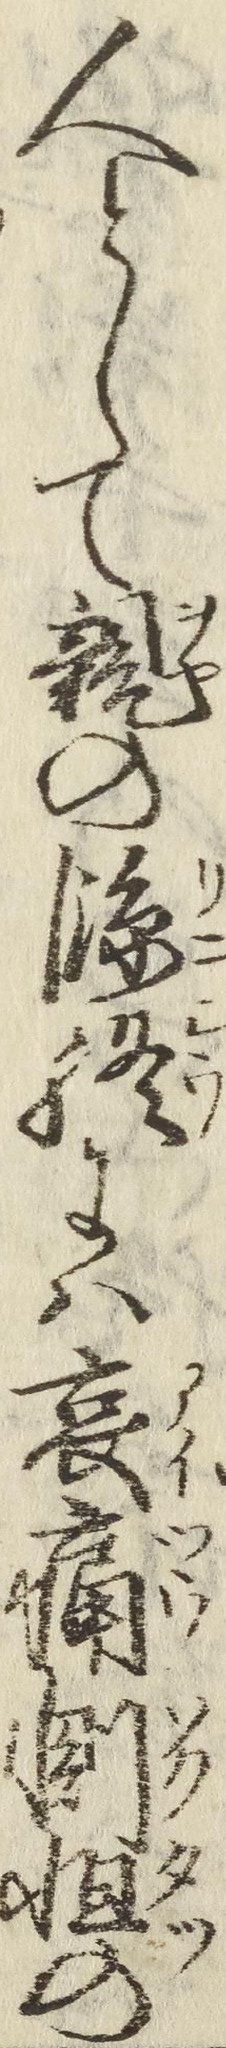人として親の臨終には哀痛惻怛の
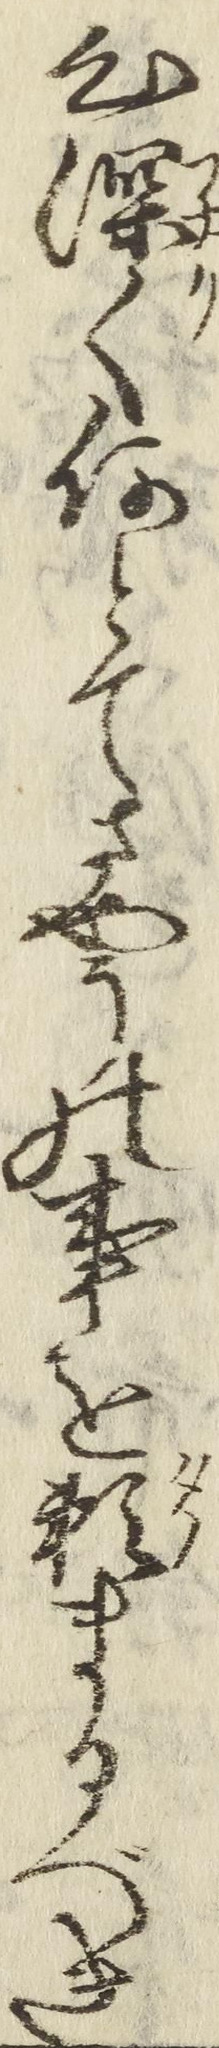心深何とてさやうの事を頼まるべき
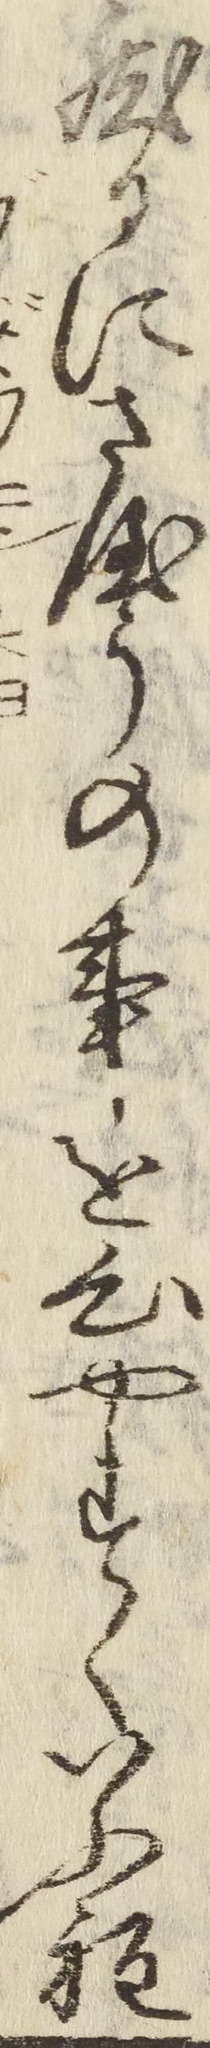然るにさやうの事を心やすくいふ程
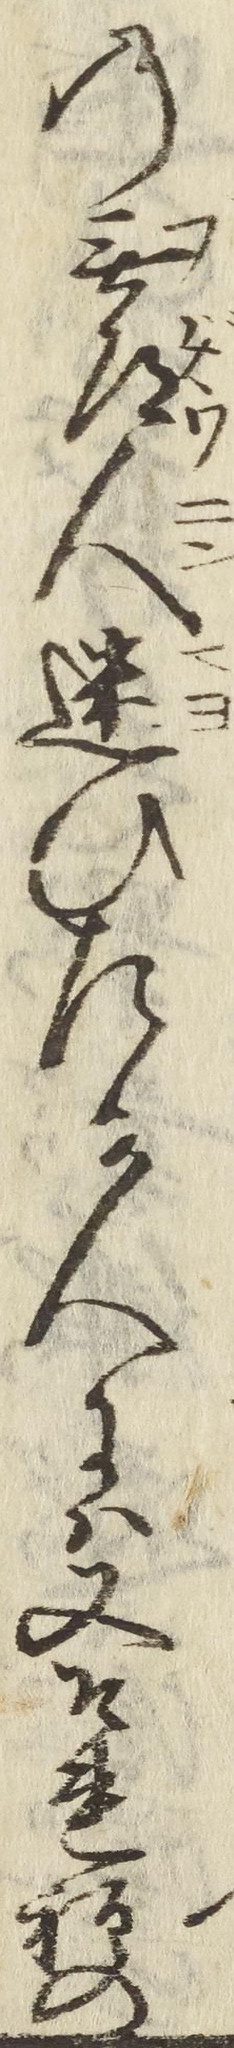の無道人迷ひたる人には又それ程の

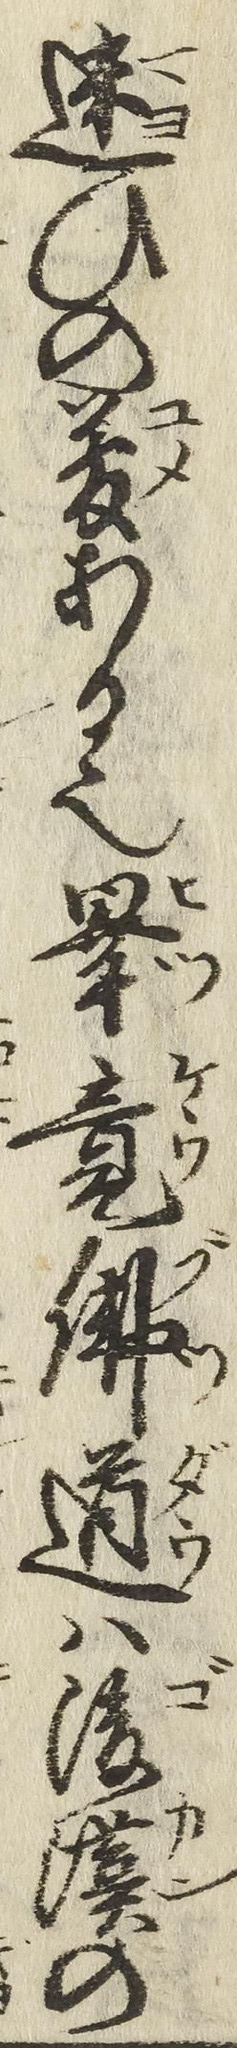迷ひの夢ある也畢竟仏道は後漢の
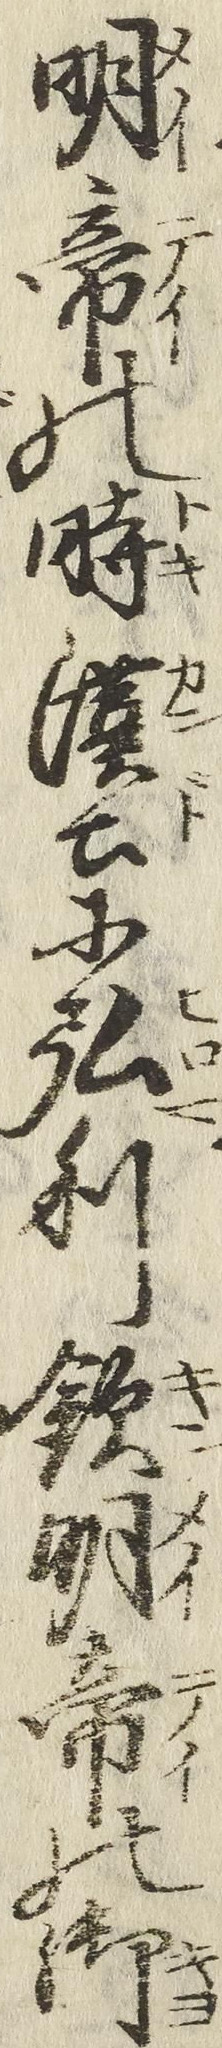明帝の時漢土に弘り欽明帝の御
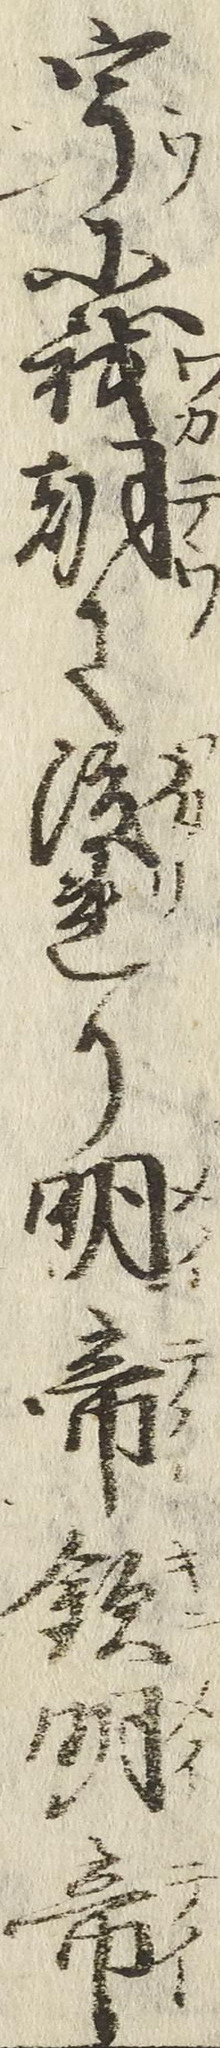宇に我朝に渡れり明帝欽明帝
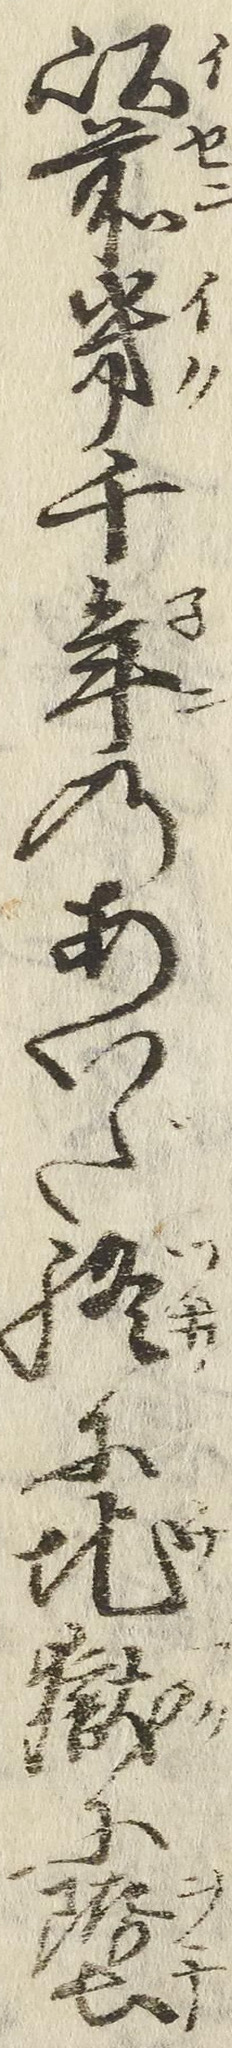以前幾千年のあいだ終に地獄に墜
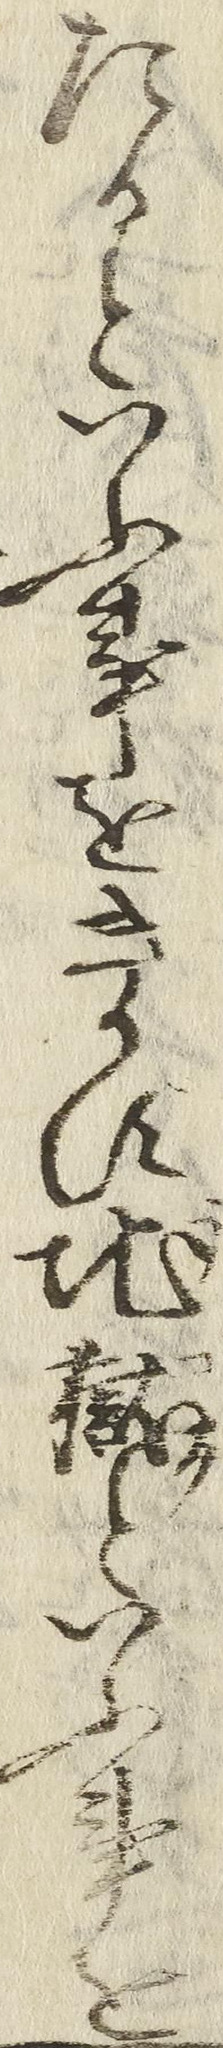たるといふ事をきかず地獄といふ事を
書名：天地或問珍　地
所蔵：東京大学地震研究所図書室 Earthquake Research Institute Library, The University of Tokyo, JAPAN
